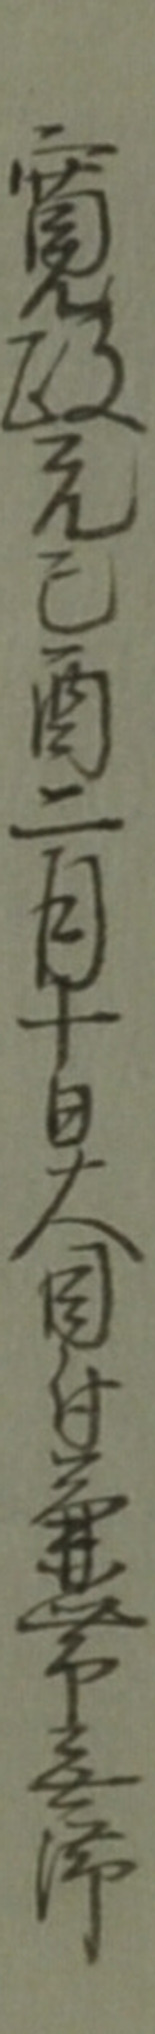一寛政元己酉二月十日大目付兼帯無滞
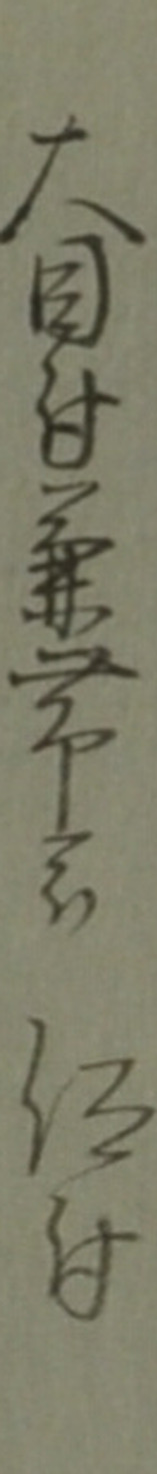大目付兼帯被仰付
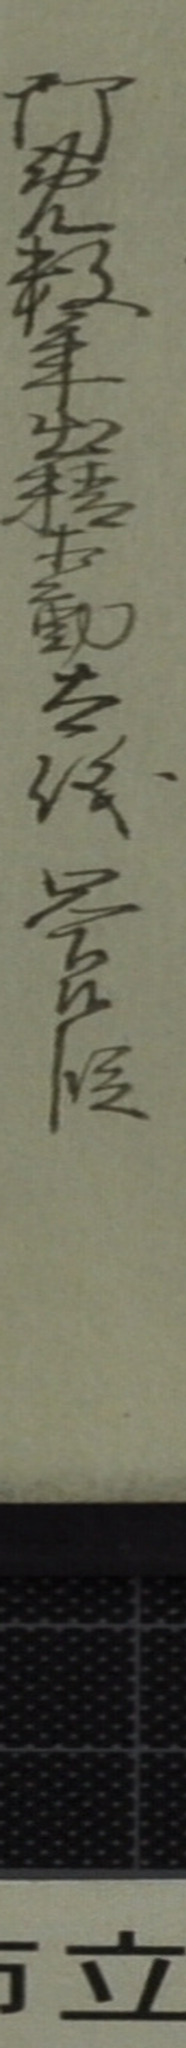御免数年出精相勤太儀思召候段
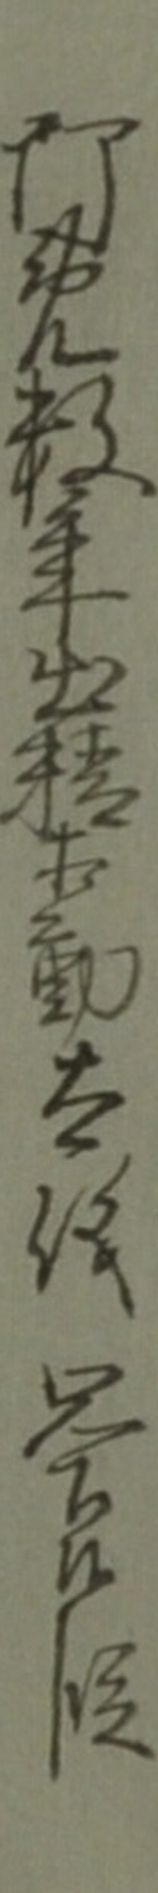御免数年出精相勤太儀思召候段
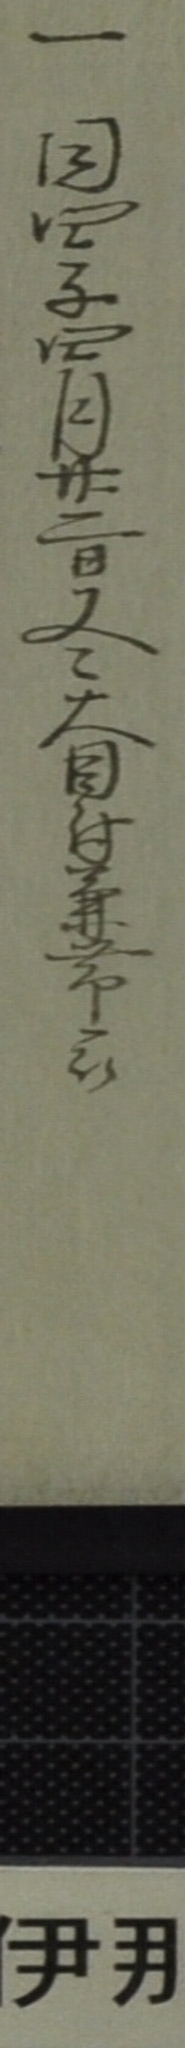一同四子四月廿二日又々大目付兼帯被
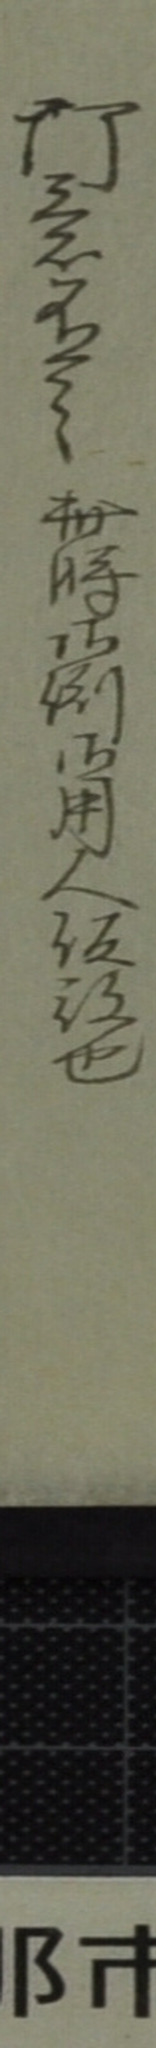御意有之此時御側御用人仮役也
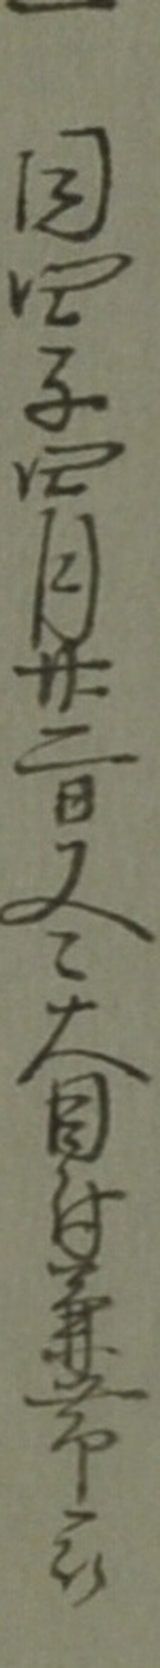一同四子四月廿二日又々大目付兼帯被
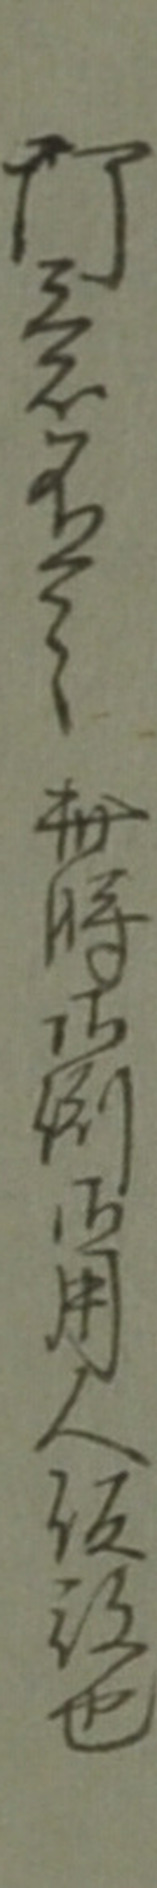御意有之此時御側御用人仮役也
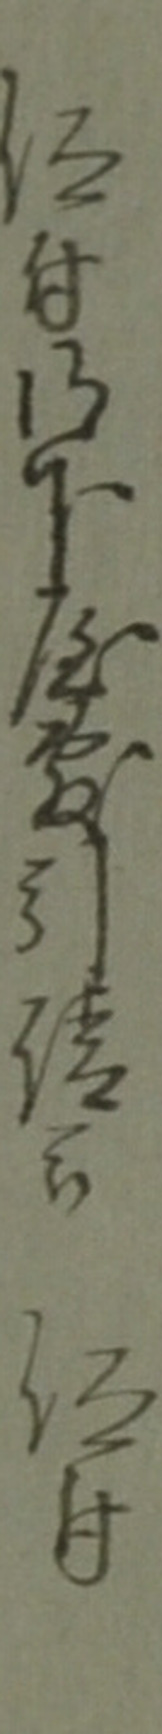仰付御下屋敷引請被仰付
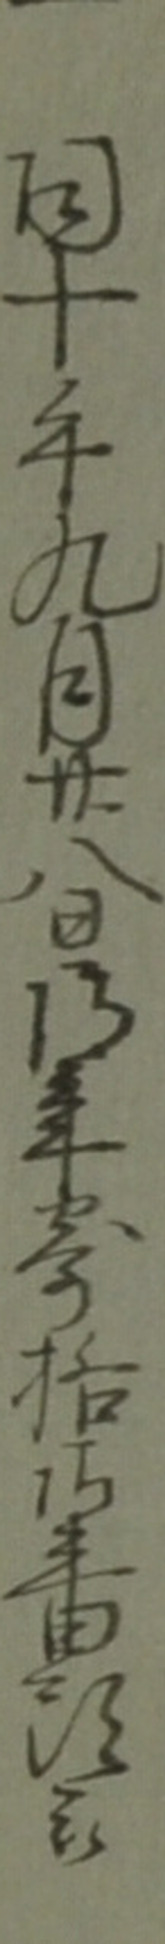一同十午九月廿八日御年寄格御番頭被
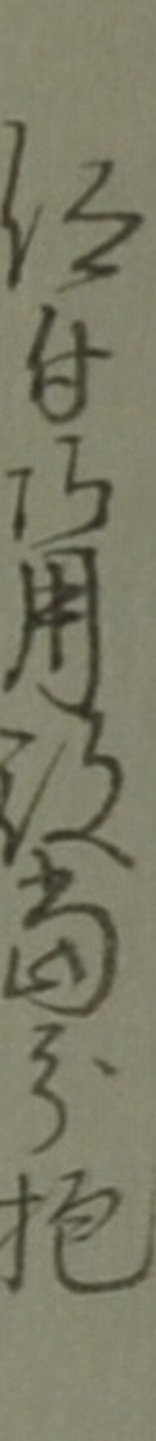仰付御用役当分抱
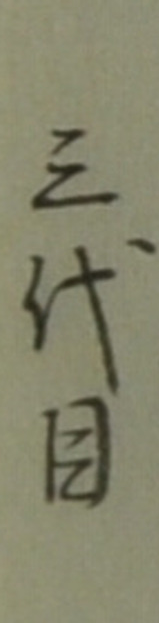三代目

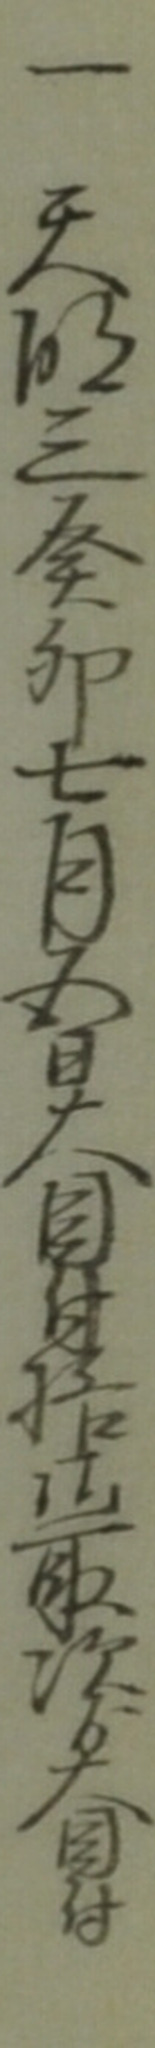一天明三癸卯七月五日大目付格御取次ゟ大目付
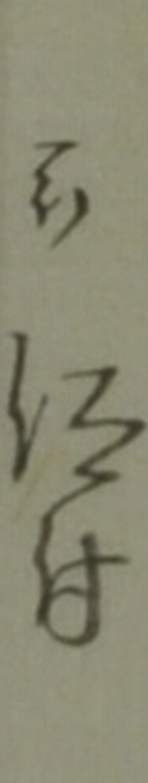被仰付
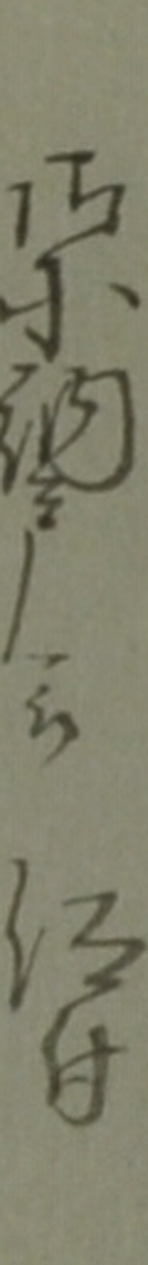御小納戸被仰付
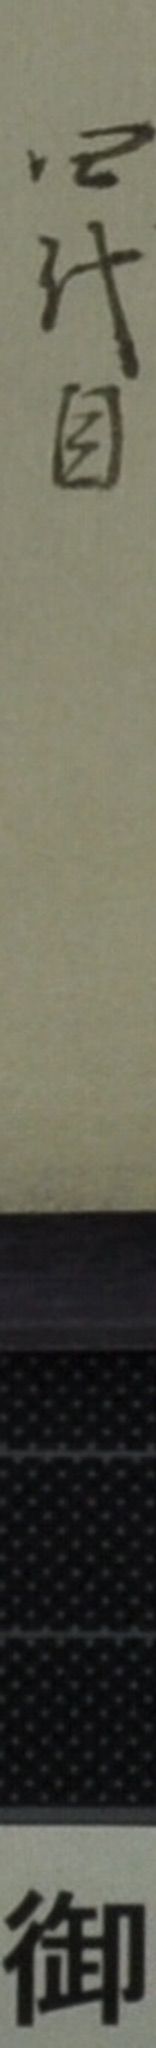四代目
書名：諸御役代々録（三）
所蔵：伊那市立高遠町図書館・合同会社AMANE
